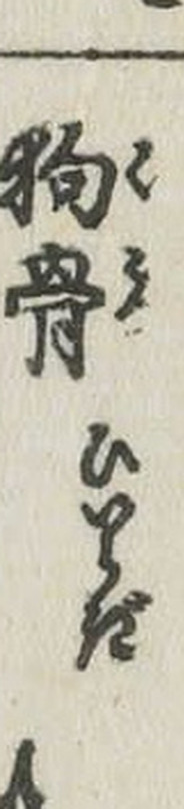狗骨ひいらぎ
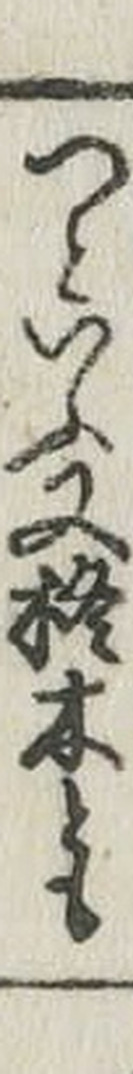つといふ又柊木とも
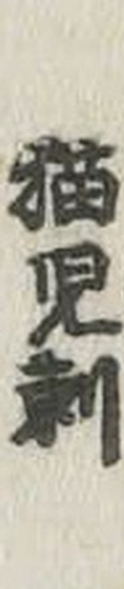猫児刺
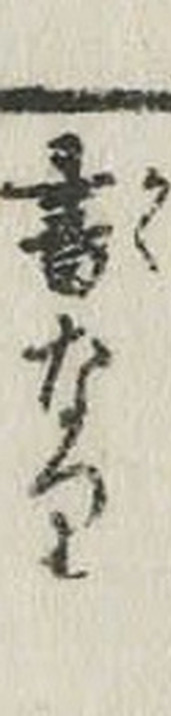書なり
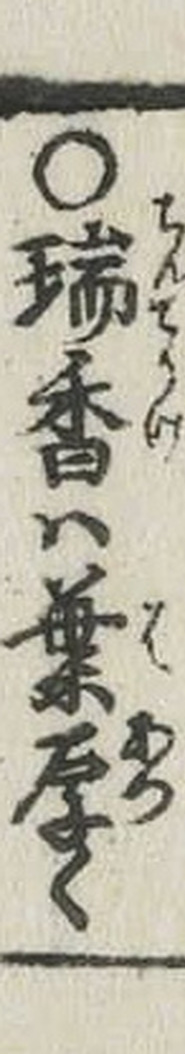○瑞香は葉厚く
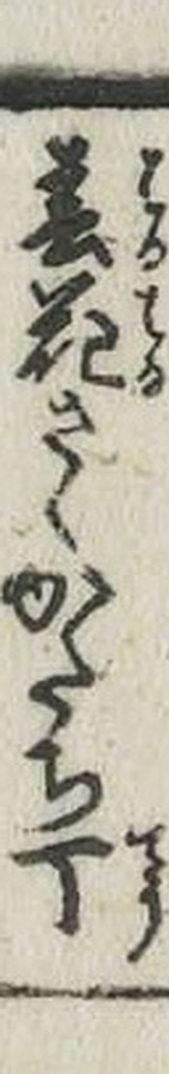春花さくかたち丁
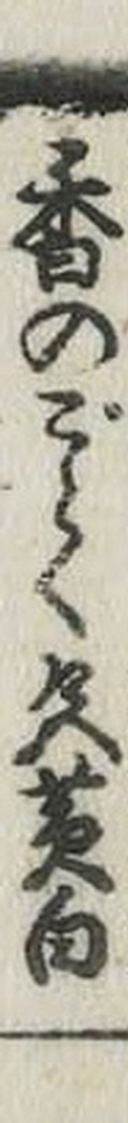香のごとく色黄白
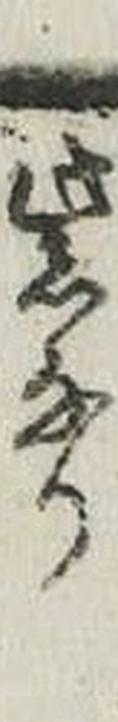紫なり
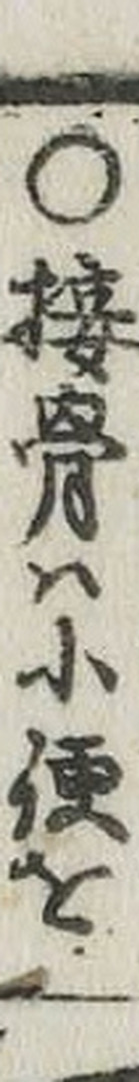○接骨は小便を
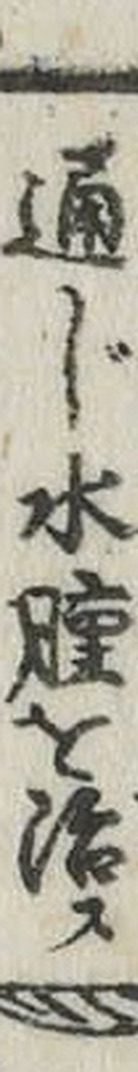通じ水腫を治ス
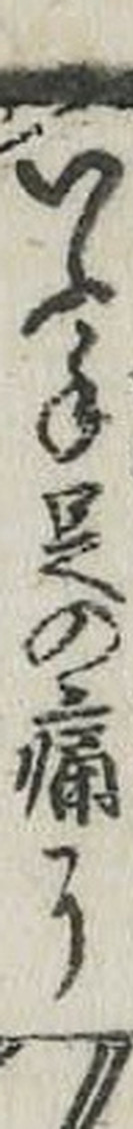いふ手足の痛つり
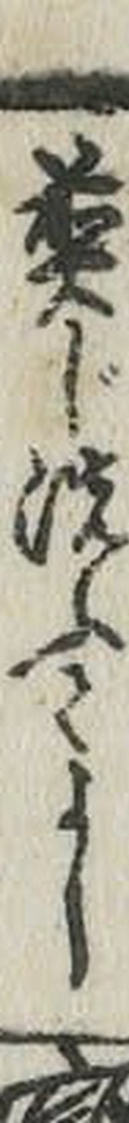煎じ洗ふてよし

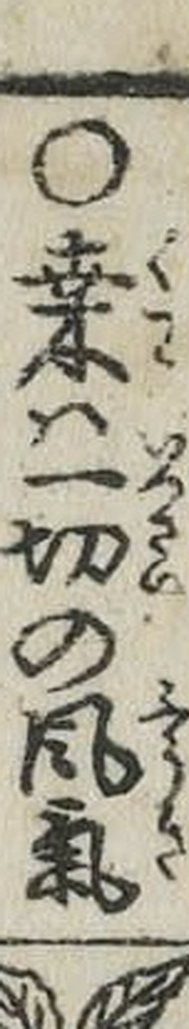○桑は一切の風気
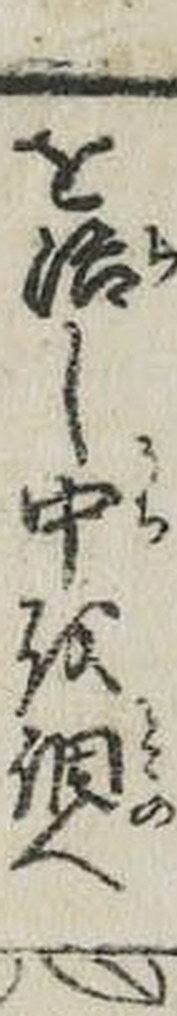を治し中を調へ
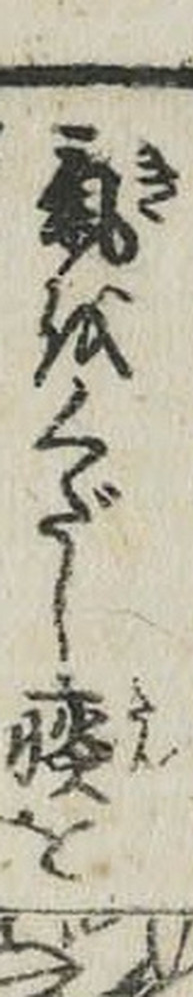気をくだし痰を
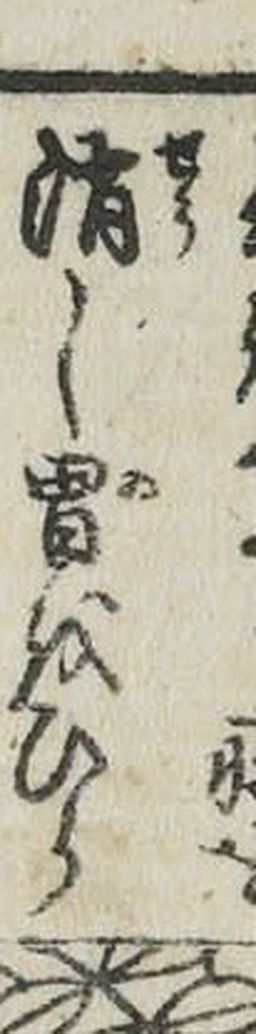消し胃をひら
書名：増補頭書訓蒙図彙大成 10巻 8:巻之17-19
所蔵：東京学芸大学教育コンテンツアーカイブ
